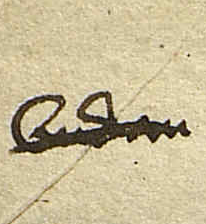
vnd an
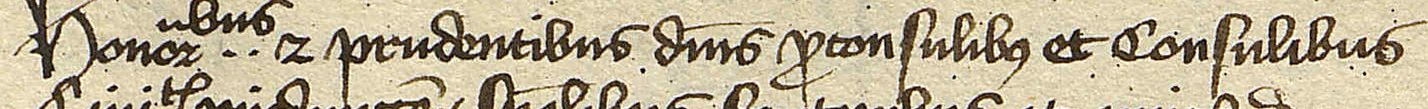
Honor* @ prudentibus d*m*s p*conſulib* et conſulibus
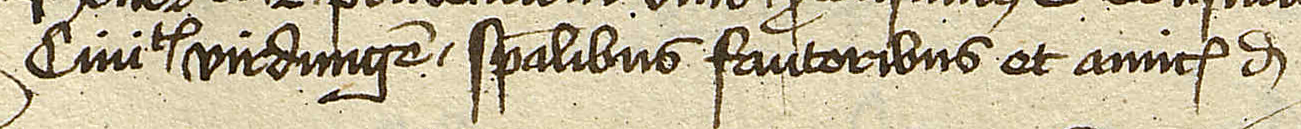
Ciuit* virdunge* ſp*alibus fautoribus et amic* d*
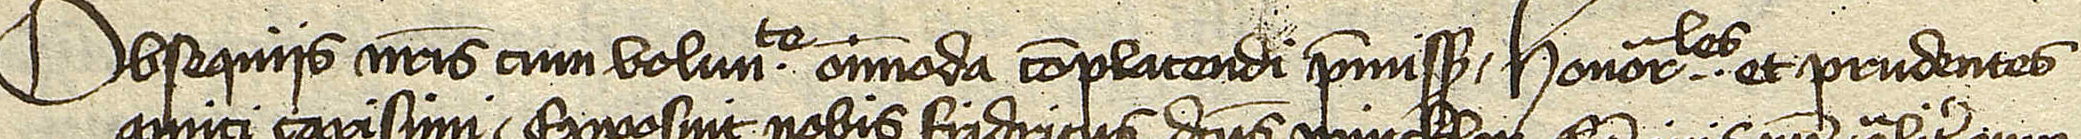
Obſequiis n*ris cum volun* . oi*modi co*placendi p*miſſ* / Honor* et prudentes
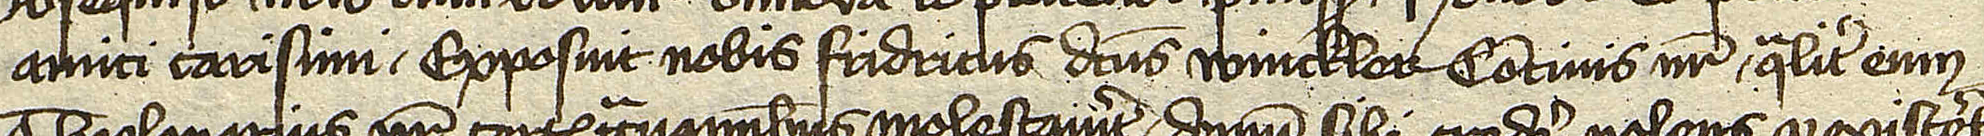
amici cariſimi / Expoſuit nobis Fridricus d*tus winckler Co*ciuis n*r / q*lit* eum
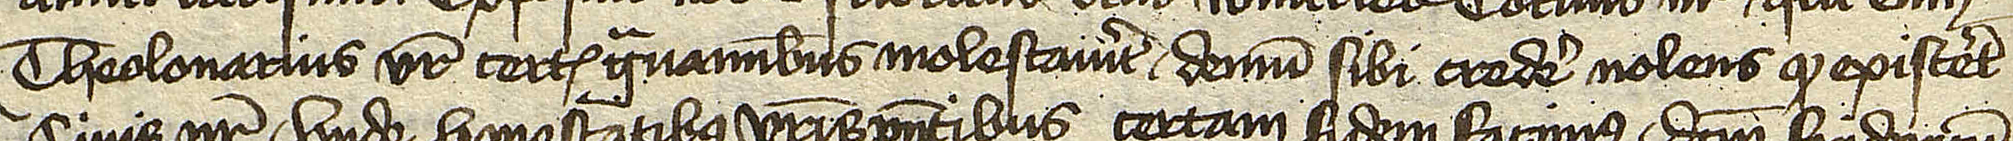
Theolonarius v*r cert* g*uimi*bus moleſtant* / demu* ſibi crede* nolens q* exiſtet*
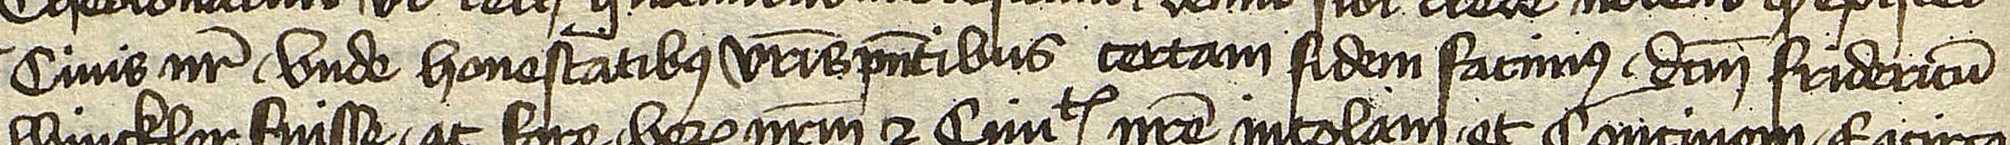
Ciuis n*r / Vnde honestatib* v*ris p*ntibus certam fidem facim* / d*c*m Fridericu*
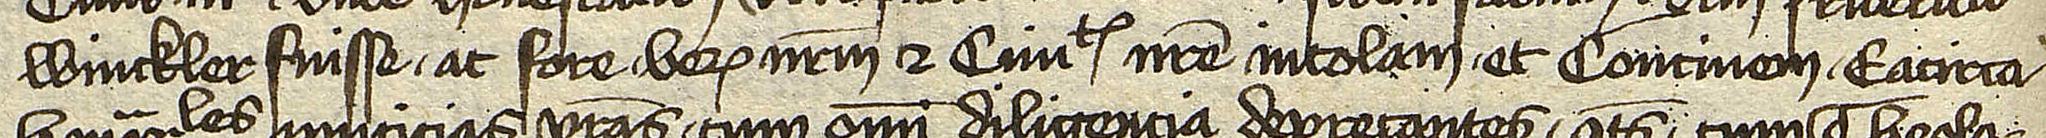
Winckler fuiſſe / ac fore / ve* n*r*m @ Ciui*tis n*re incolam / et Conciuem / Eacirca
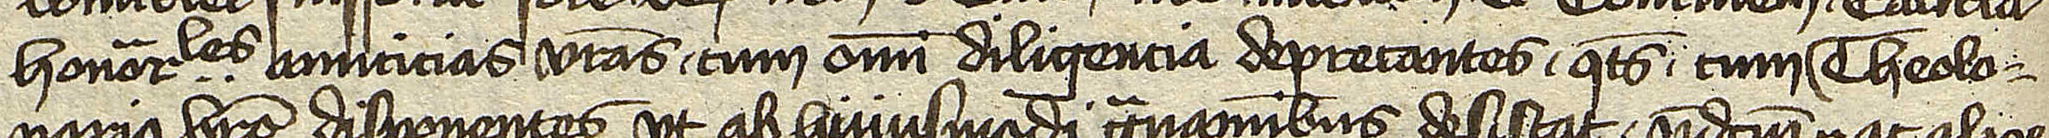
honor* amicicias v*ras / cum om*i diligencia deprecantes / q*t*s cum Theolo =
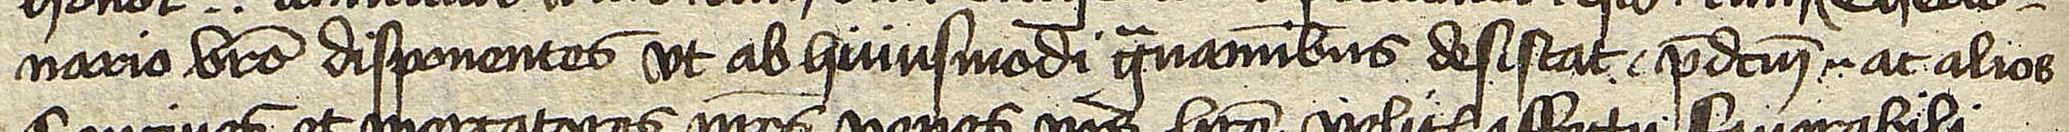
nario v*ro diſponentes vt ab huiuſmodi g*uimi*bus deſiſtat / P*d*c*m ~ ac alios
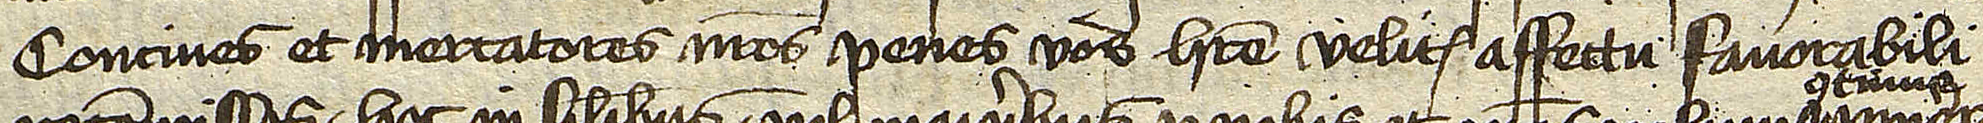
Conciues et mercatores n*ros penes vos h*re velit* affectu fauorabili
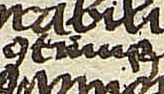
*tinue
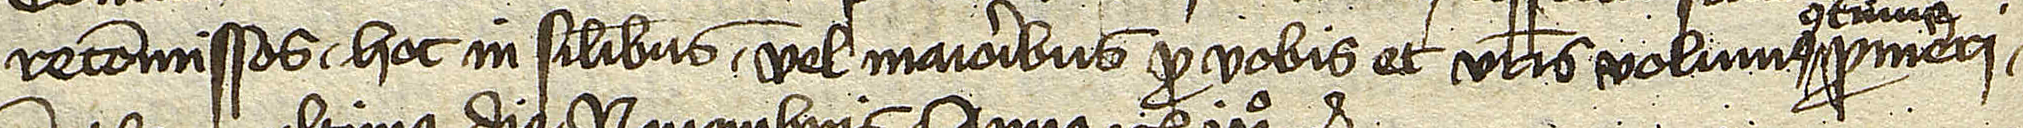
reco*miſſos / hoc in filibus / vel maior*bus p* vobis et v*ris volum* p*me*ri /
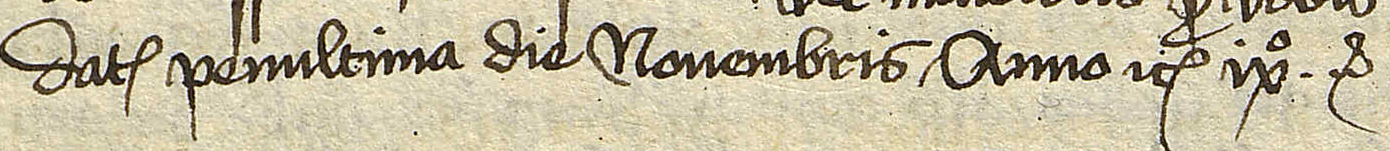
Dat* penultima die Nouembris / Anno ec* ix . §
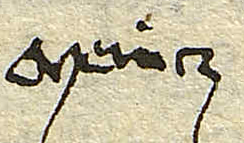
Meincʒ
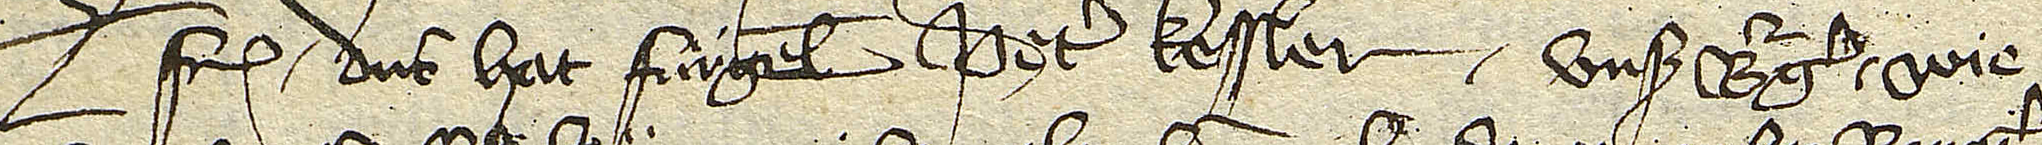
L* fr* / Vns hat fürgel* Pet* keſſler / vnſ* B*g* / wie
